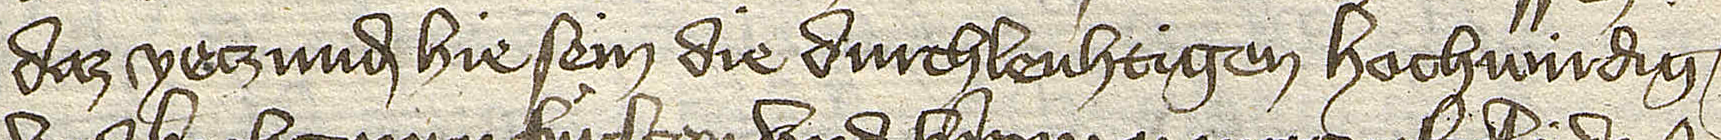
daʒ yecʒund* hie ſein die durchleuhtigen hochwirdig*
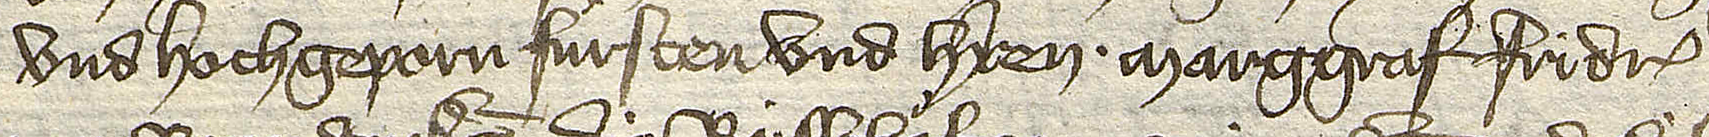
vnd hochgeporn fürſten vnd h*ren . Marggraf Fridr*
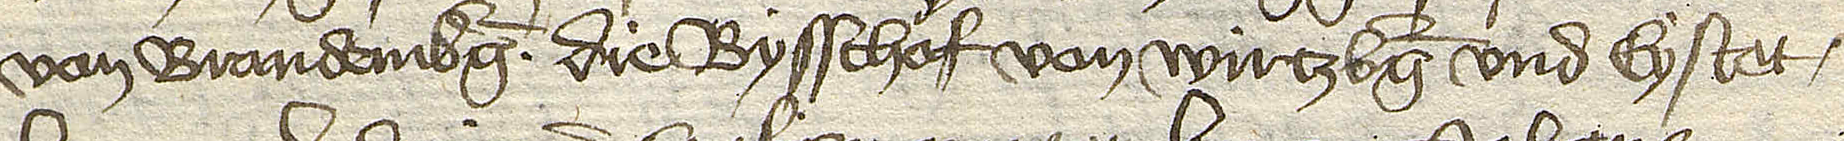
von Brandemb*g . die Byſſchöf von wircʒb*g vnd Eyſtet*
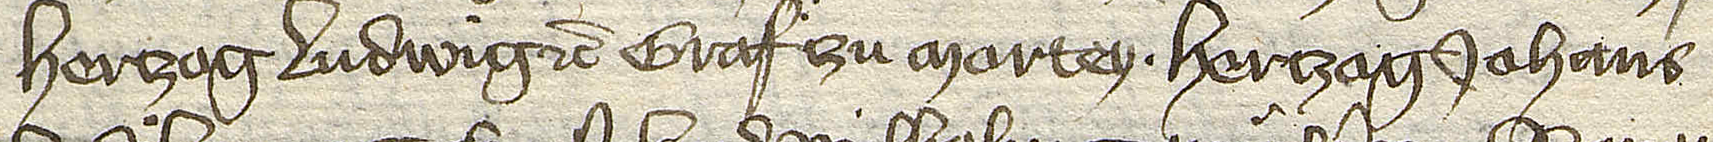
hercʒog Ludwig ec* Graf cʒu Mortey . hercʒog Iohans
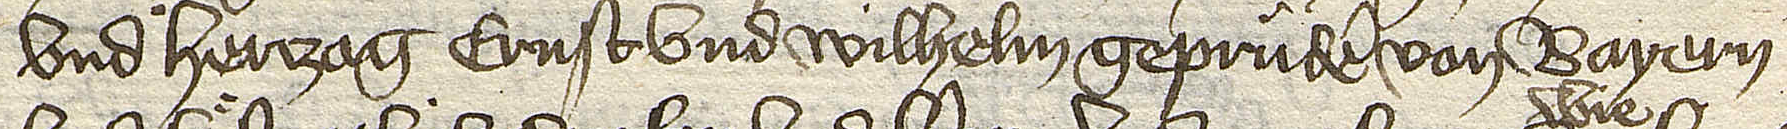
vnd hercʒog Ernſt vnd wilhelm geprüde* von Bayern
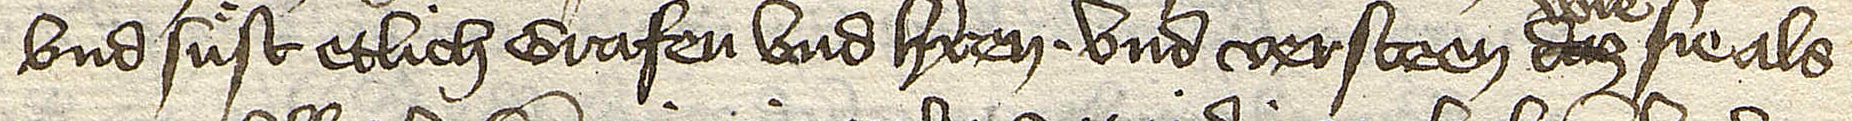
vnd ſüſt etlich Grafen vnd h*ren . vnd verſteen daʒ ſie als
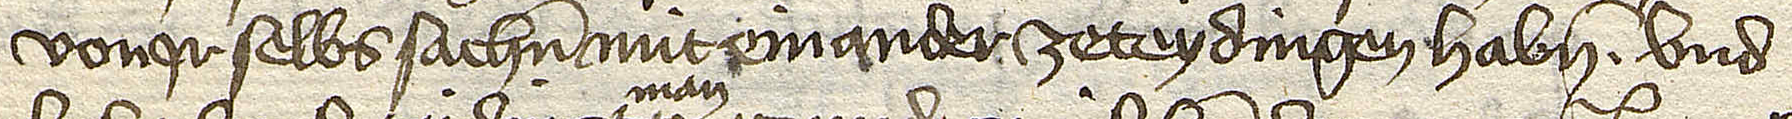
von Ir ſelbs ſachn* mit einander cʒeteydingen habn* . vnd
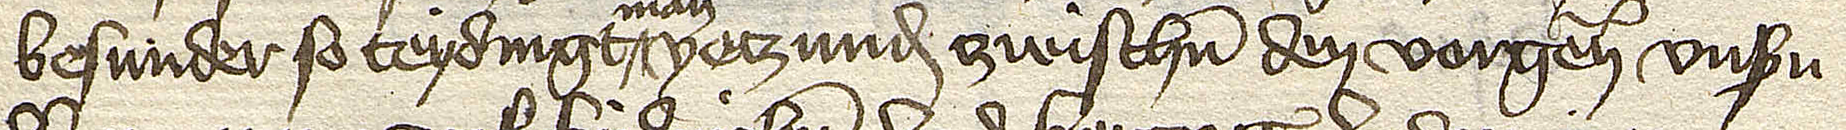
beſunder ſo teytingt yecʒund* cʒwiſchn* den vorgen* vnſ*n
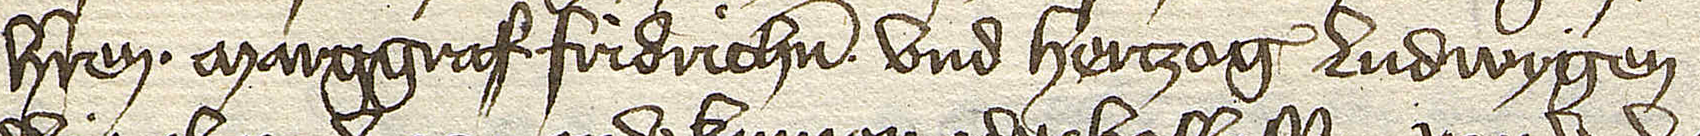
h*ren . Marggraf fridrichn* . vnd hercʒog* Ludwygen
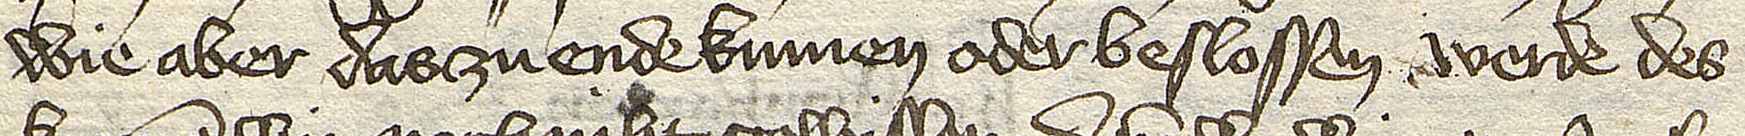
wie aber das cʒu ende kumen oder beſloſſen werde des
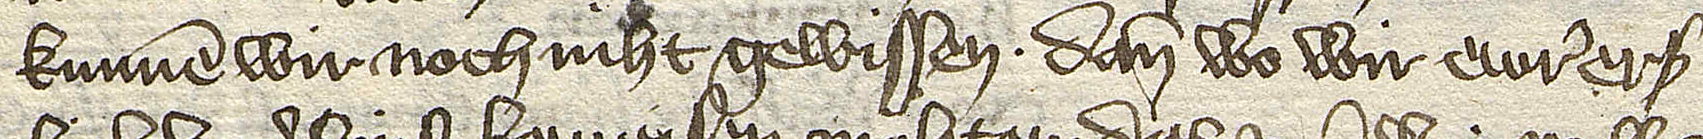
kunne* wir noch niht gewiſſen . Dan* wo wir ewr* erſ*
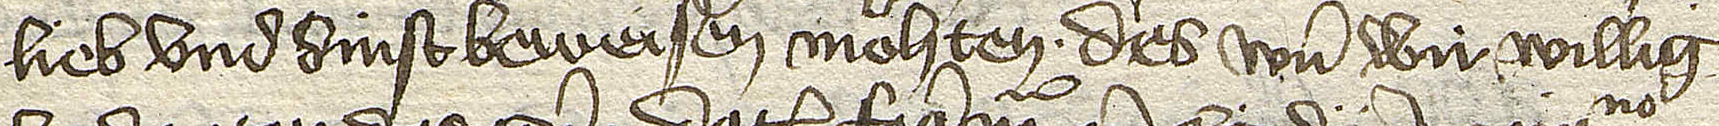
lieb vnd dinſt beweiſen möhten . des wn* wir willig
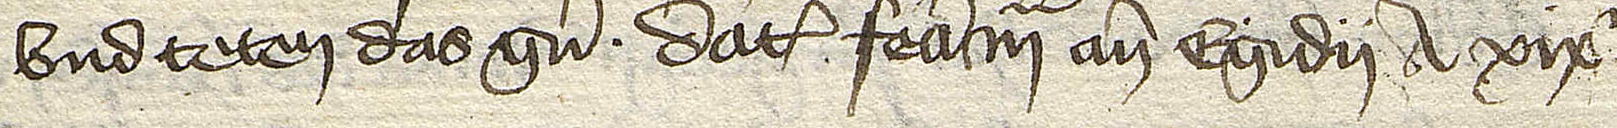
vnd teten das gn* . Dat* fea* iii* an* Egidii A xix*
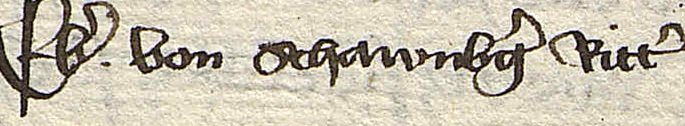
Eb* von Schawnb*g Ritt*
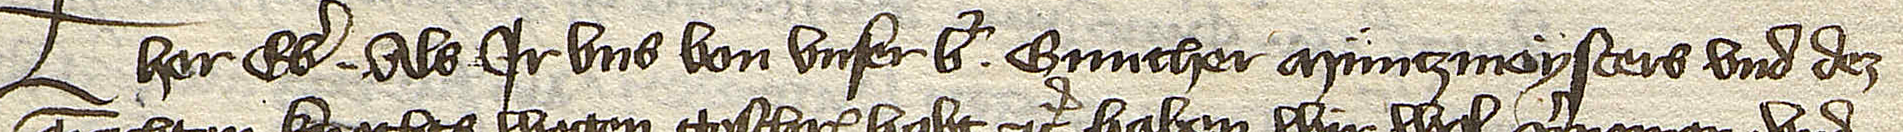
L* her Eb* . Als Ir vns von vnſer b* Gunther Müncʒmeyſters vnd deʒ
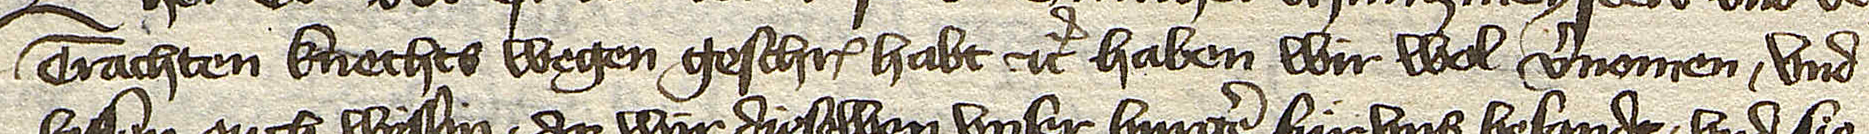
Trachten knechts wegen geſchr* habt ec* haben wir wol v*nomen / vnd
